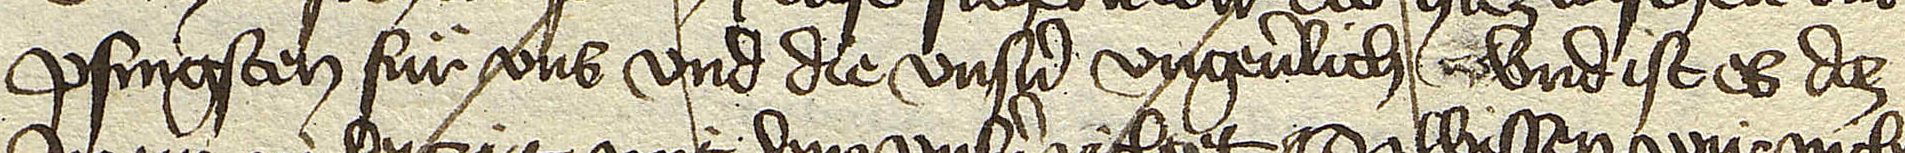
Pfingſten für vns vnd die vnſn* vngeu*lich vnd iſt es daʒ
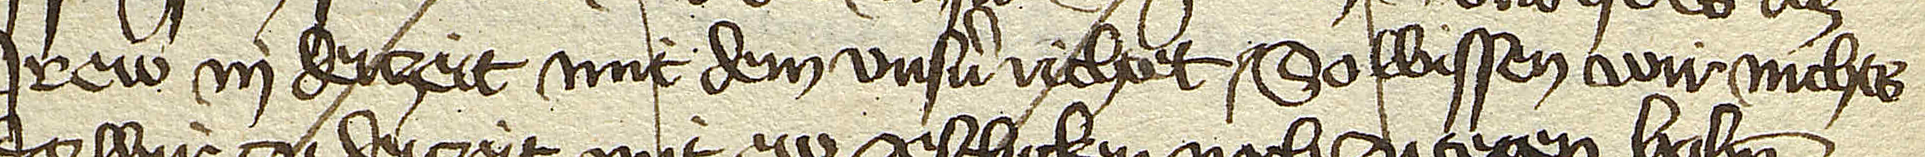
Ir ew in dercʒeit mit dem vnſn* richtet / So wiſſen wir nichts
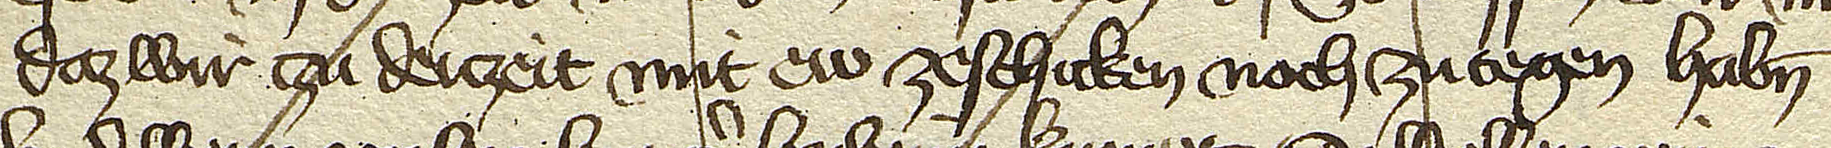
daʒ wir cʒu dercʒeit mit ew cʒeſchicken noch cʒu tegen habn*
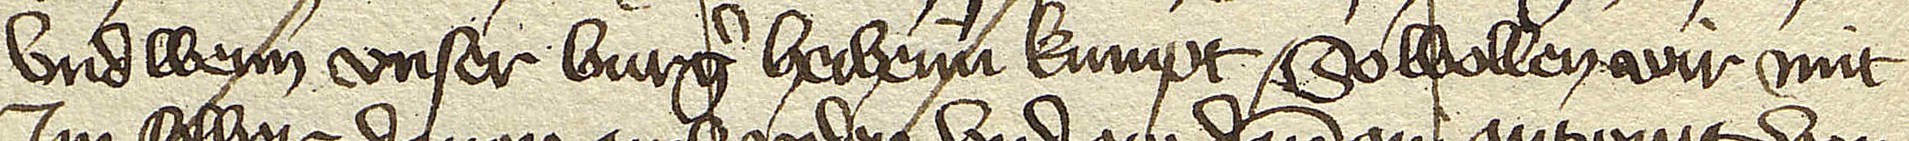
vnd wenn vnſer burg* herheim kumpt / So wollen wir mit
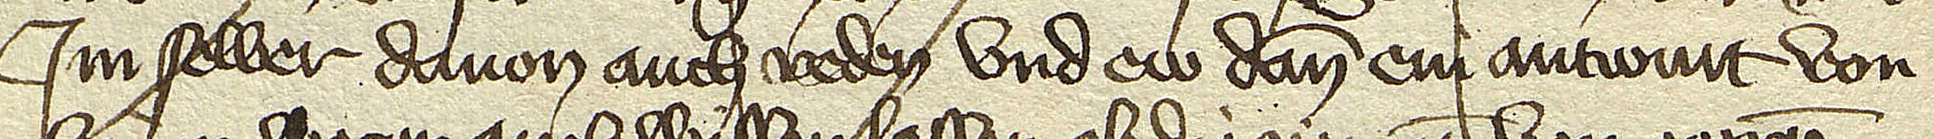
Im ſelber dauon auch reden vnd ew dan* ein antwurt von
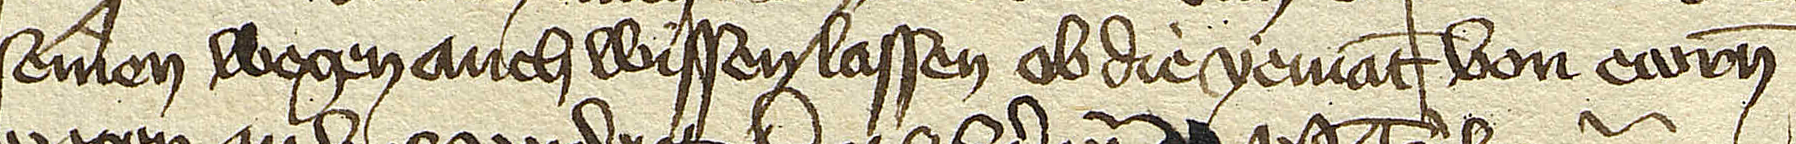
ſeinen wegen auch wiſſen laſſen ob die yemat* von ewrn*
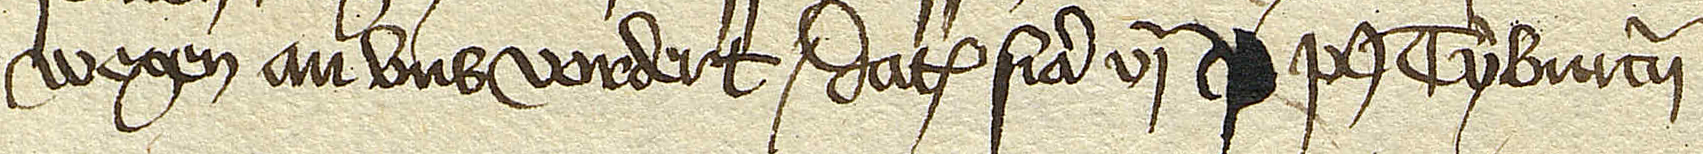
wegen an vns vordert / Dat* fia* vi* p p* Tyburcii*
